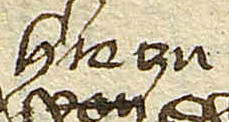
h*re cʒu
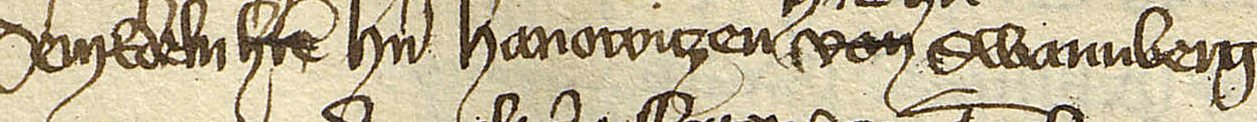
Dem Edeln h*re hanowicʒen von Swannberg
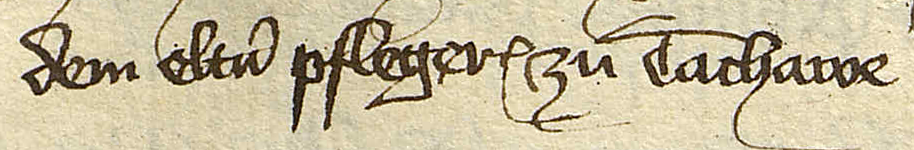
dem eltn* pfleger* cʒu Tachawe
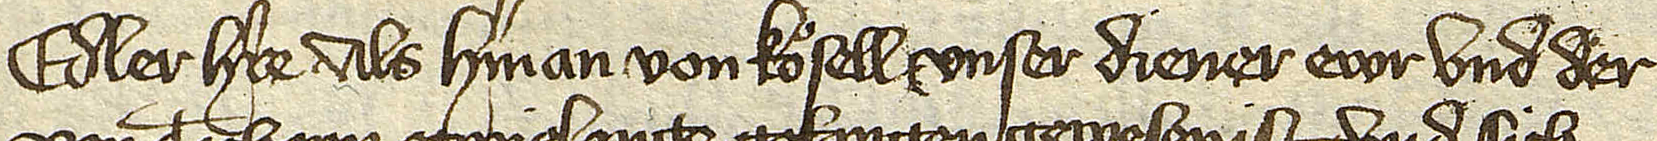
Edler h*re / Als h*man von Köſell vnſer diener ewr vnd der
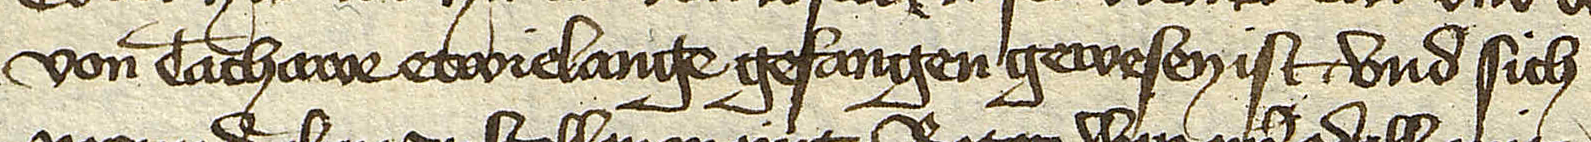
von Tachawe etwielange gefangen geweſen iſt / vnd ſich
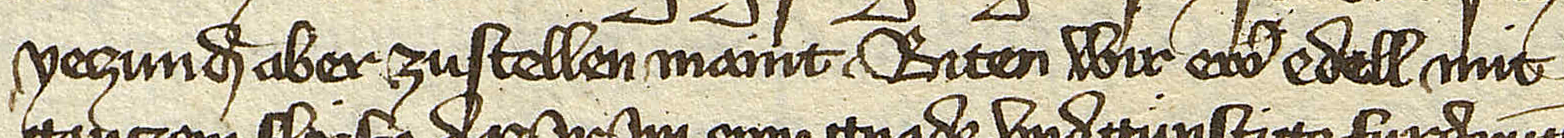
yecʒund* aber cʒuſtellen maint / Biten wir ew* edell mit
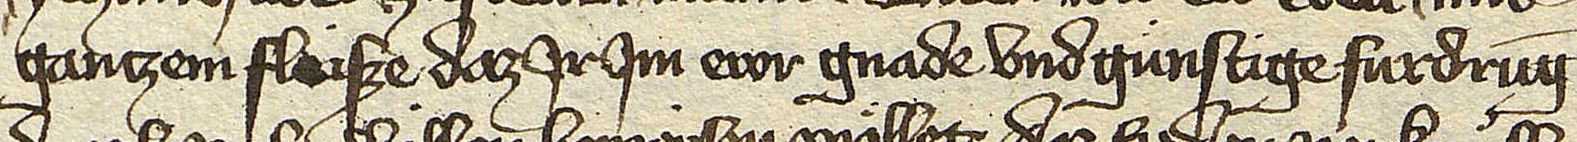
gancʒem fleiſʒe daʒ Ir Im ewr gnade vnd günſtige furdrug*
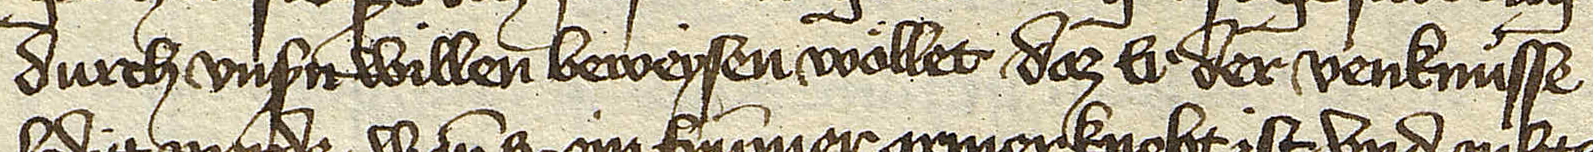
durch vnſ*n willen beweyſen wöllet / daʒ Er der venknüſſe
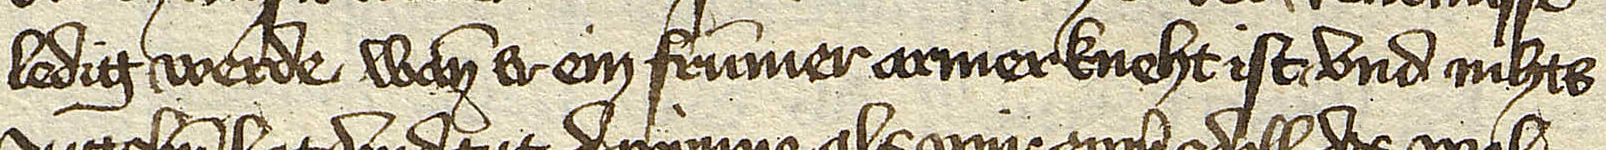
ledig werde / wan* Er ein frumer* armer kneht iſt / vnd nihts
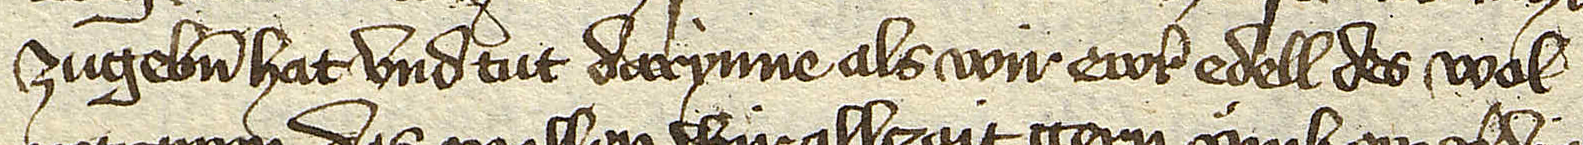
cʒugebn* hat / vnd tut darynne als wir ewr* edell des wol
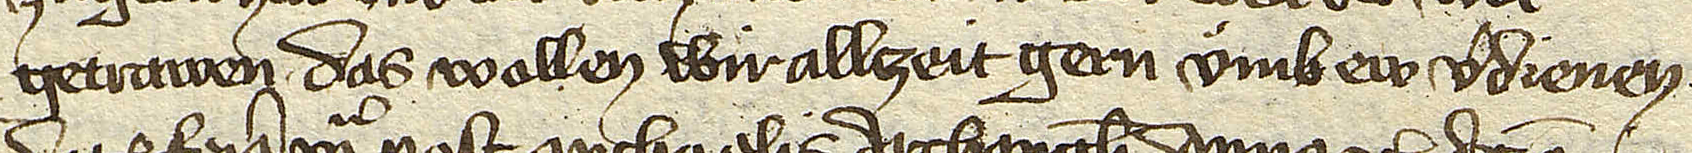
getrawen das wollen wir allcʒeit gern v̈mb ew v*dienen
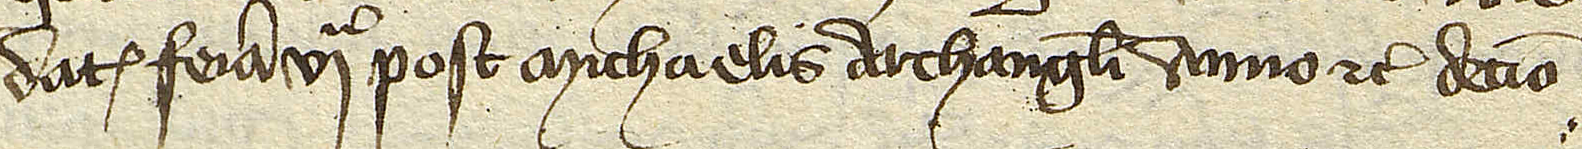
dat* feia* vi* poſt Michaelis Archangli* Anno ec* decio*
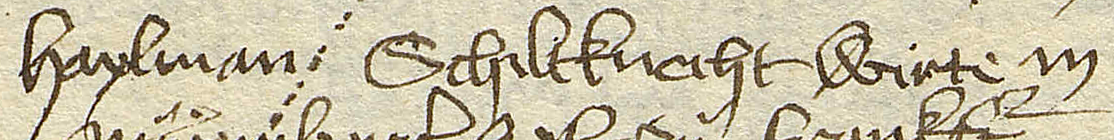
haylman Schiltknecht wirte in
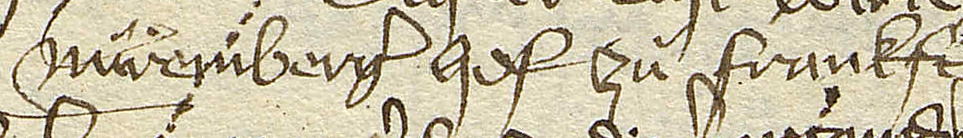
Nüremberg* hof cʒu frankf*t
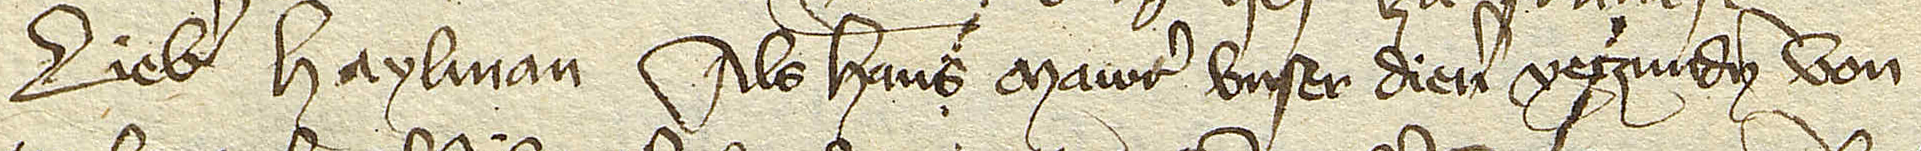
Lieb* haylman Als hans Mawr* vnſer dien* yecʒundn* von
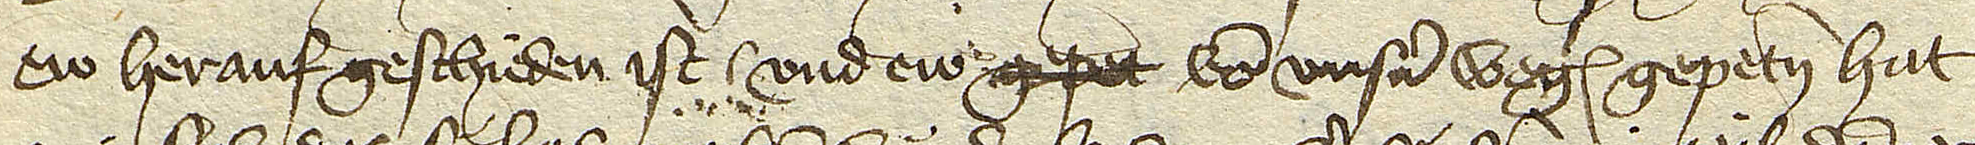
ew herauf geſchieden iſt / vnd ew gepet vo* vnſn* weg* gepetn* hat
